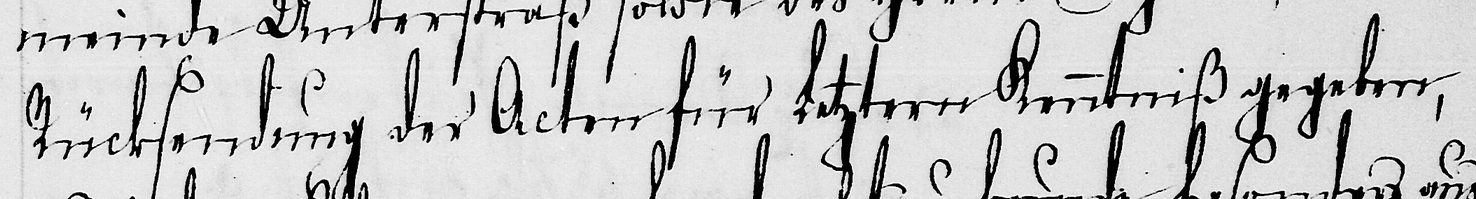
Rücksendung der Acten für Letzern Kenntniß gegeben,
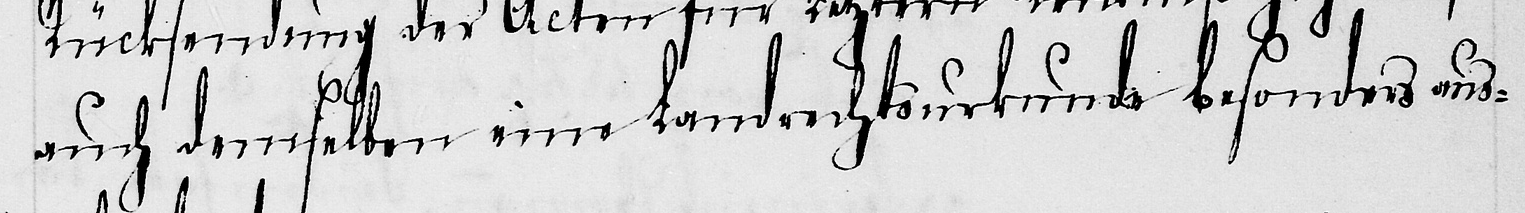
auch demselben eine Landrechtsurkunde besonders aus¬
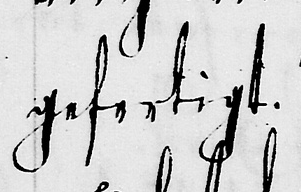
gefertigt.
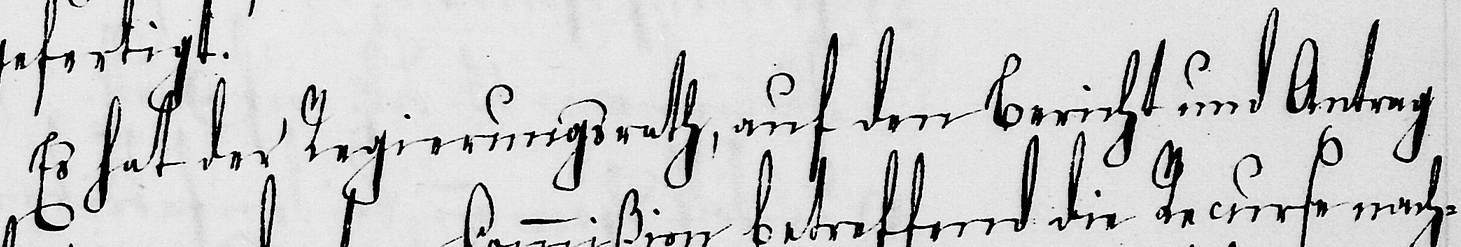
Es hat der Regierungsrath, auf den Bericht und Antrag
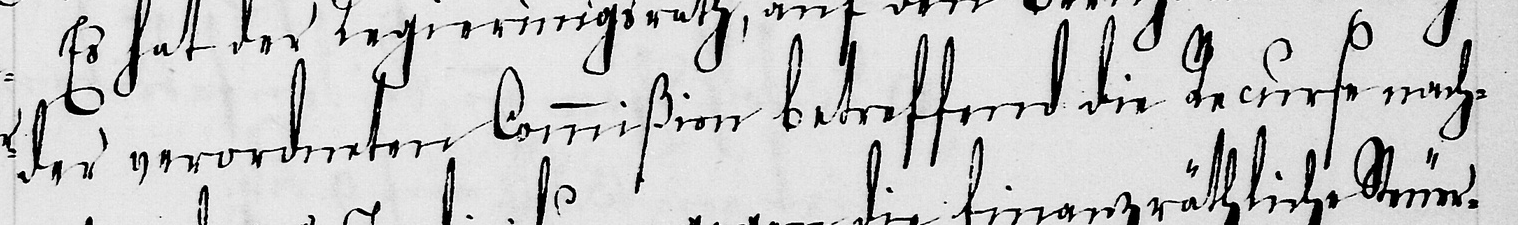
der verordneten Commißion betreffend die Recurse nach¬
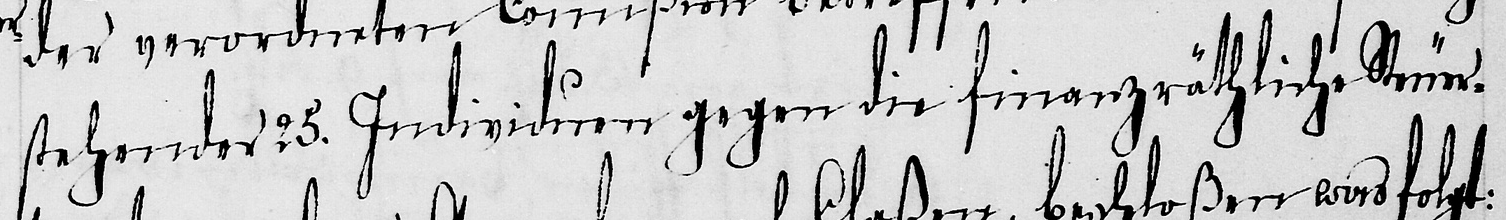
stehender 25. Individuen gegen die finanzräthliche Steue¬
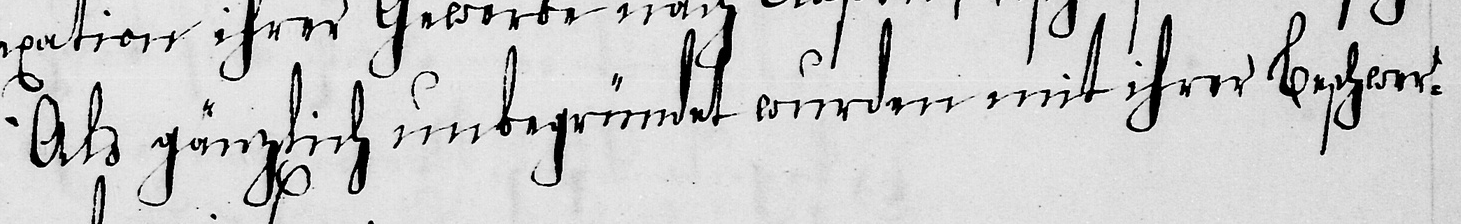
Als gänzlich unbegründet wurden mit ihrer Beschwer¬
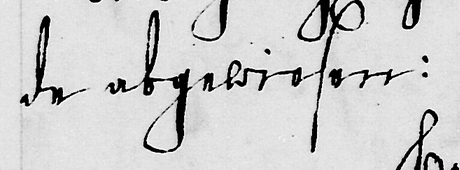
de abgewiesen:
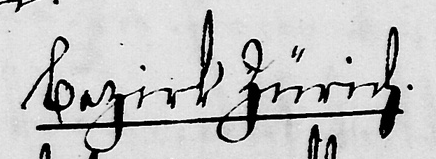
Bezirk Zürich.
